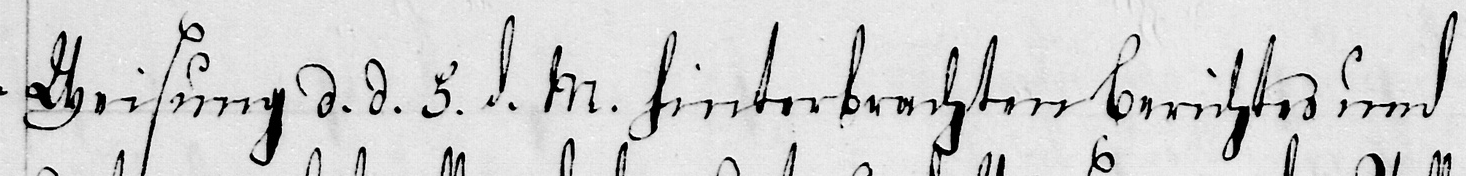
Weisung d. d. 5. d. M. hinterbrachten Berichtes und
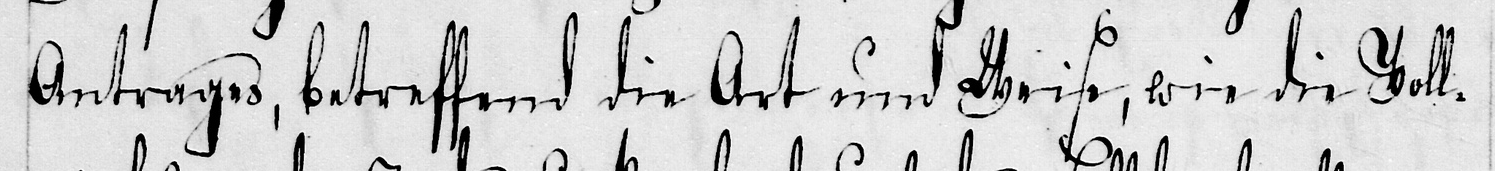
Antrages, betreffend die Art und Weise, wie die Vol¬
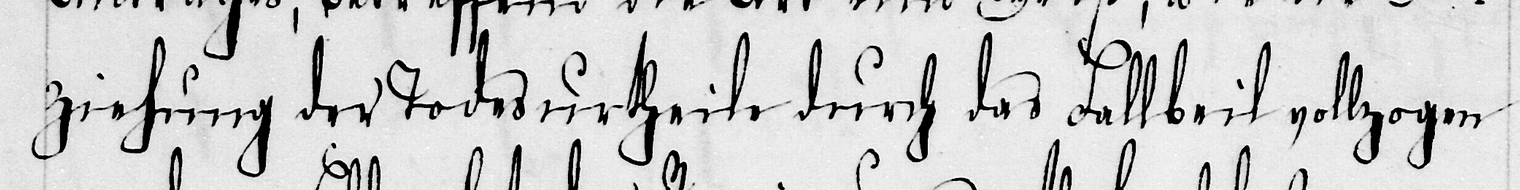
lziehung der Todesurtheile durch das Fallbeil vollzogen
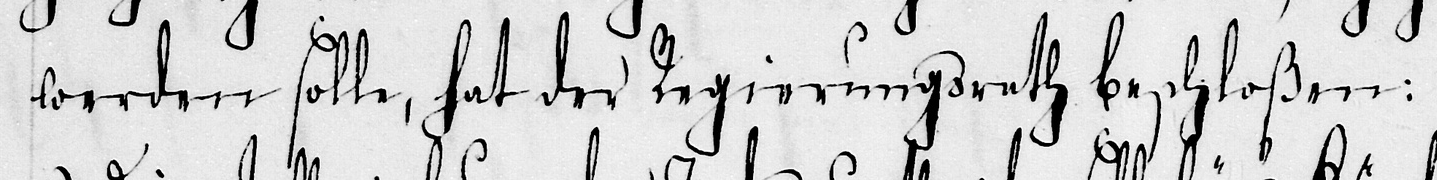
werden solle, hat der Regierungsrath beschloßen:
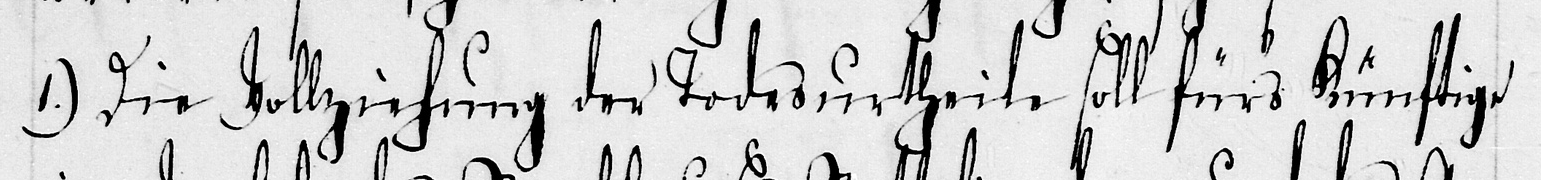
1.) Die Vollziehung der Todesurtheile soll für‘s Künftige
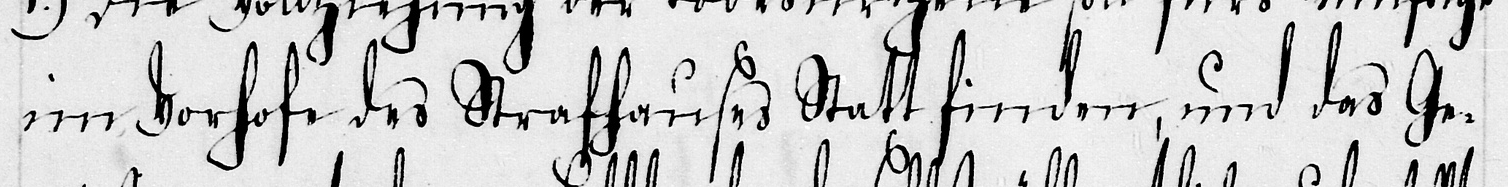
im Vorhofe des Strafhauses Statt finden, und das Ge¬
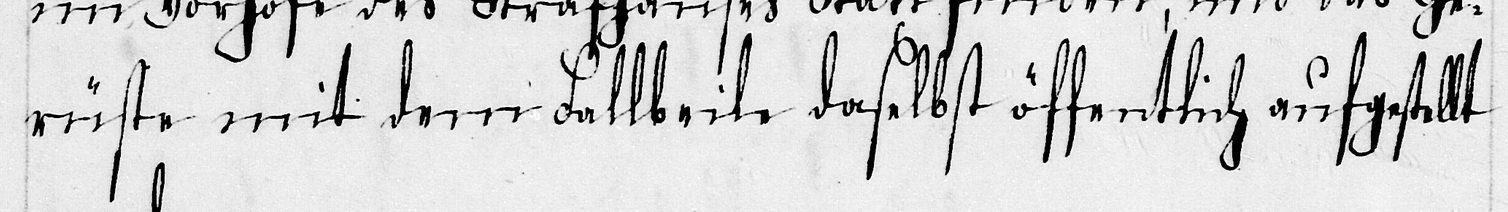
rüste mit dem Fallbeile daselbst öffentlich aufgest¬
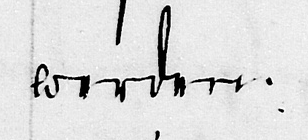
werden.
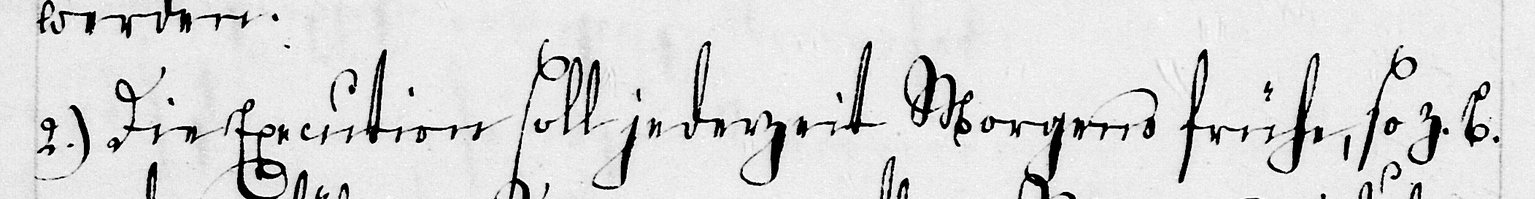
2.) Die Execution soll jederzeit Morgens frühe, so z.
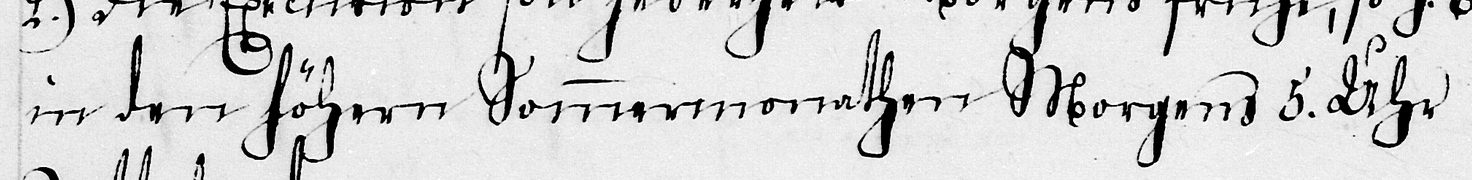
in den höhern Sommermonathen Morgens 5. Uhr
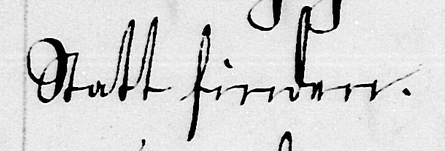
Statt finden.
